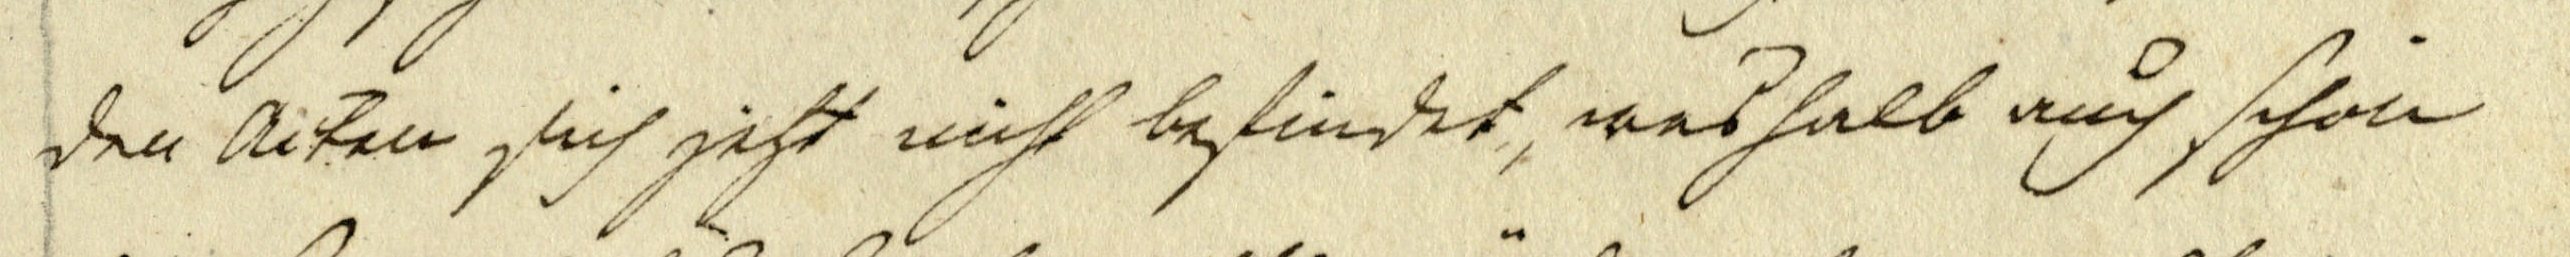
den Acten sich jetzt nicht befindet, weshalb auch schon
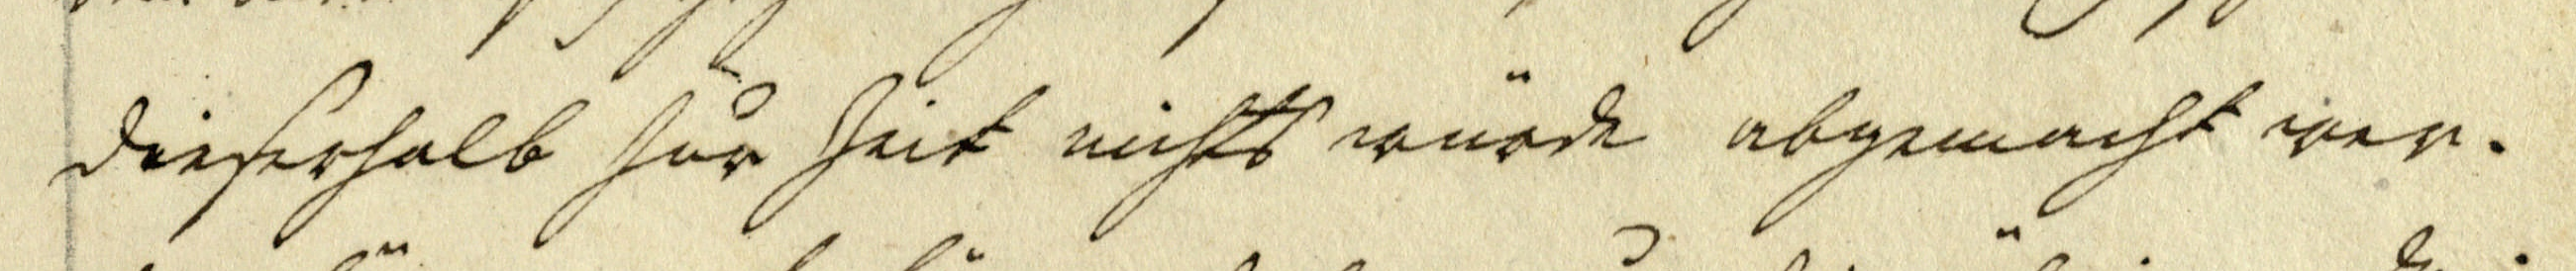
dieserhalb zur Zeit nichts würde abgemacht wer¬
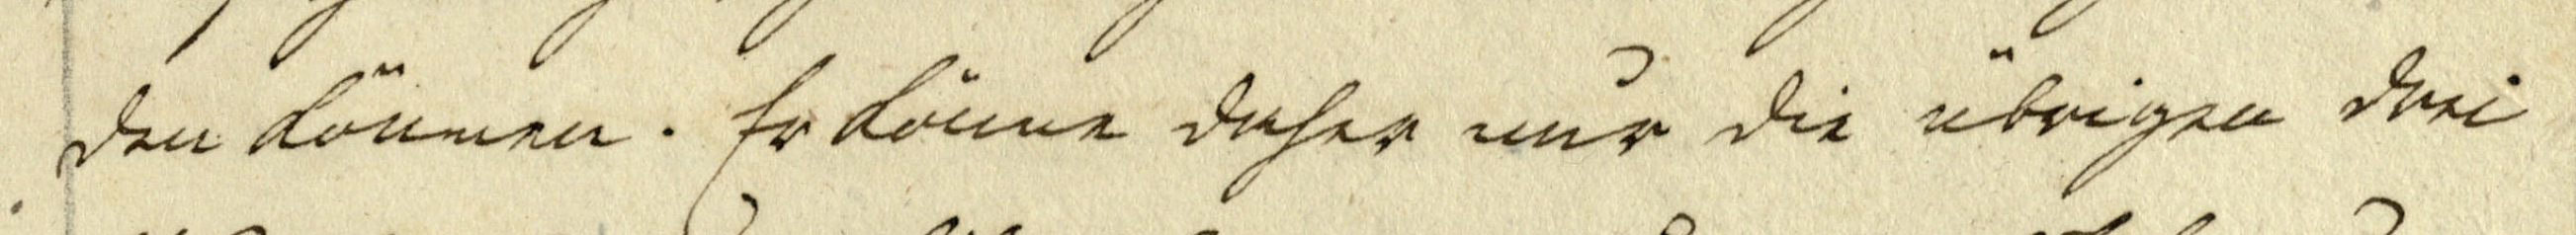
den können. Er könne daher nur die übrigen drei
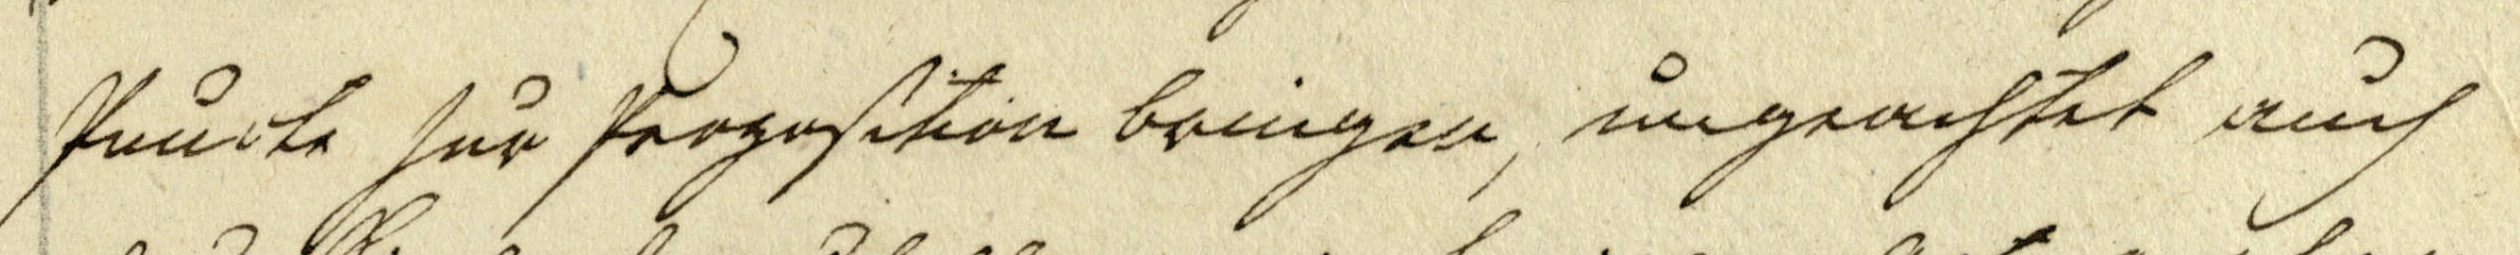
Puncte zur Proposition bringen, ungeachtet auch
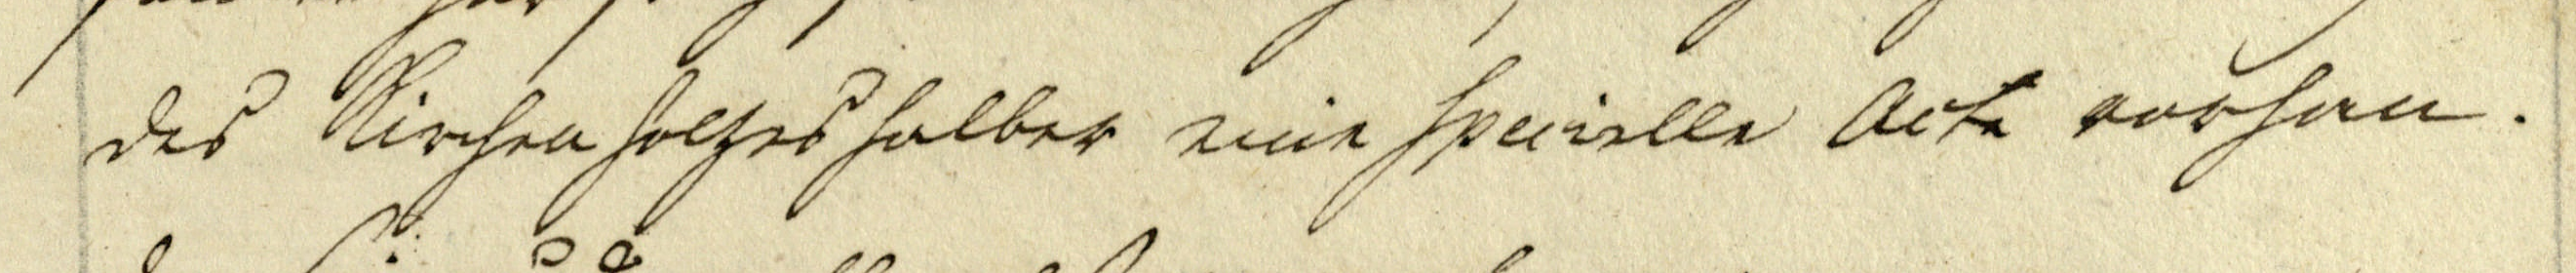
des Kirchenholzes halber eine specielle Acte vorhan¬
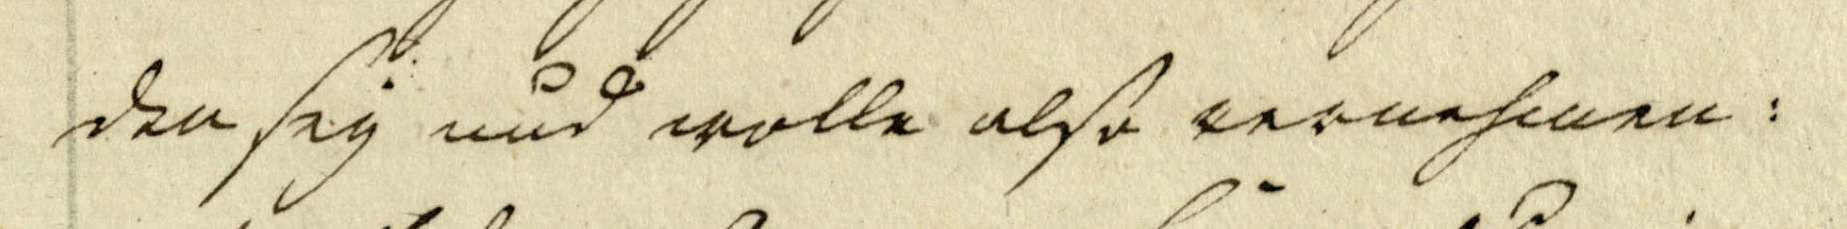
den seÿ und wolle also vernehmen:
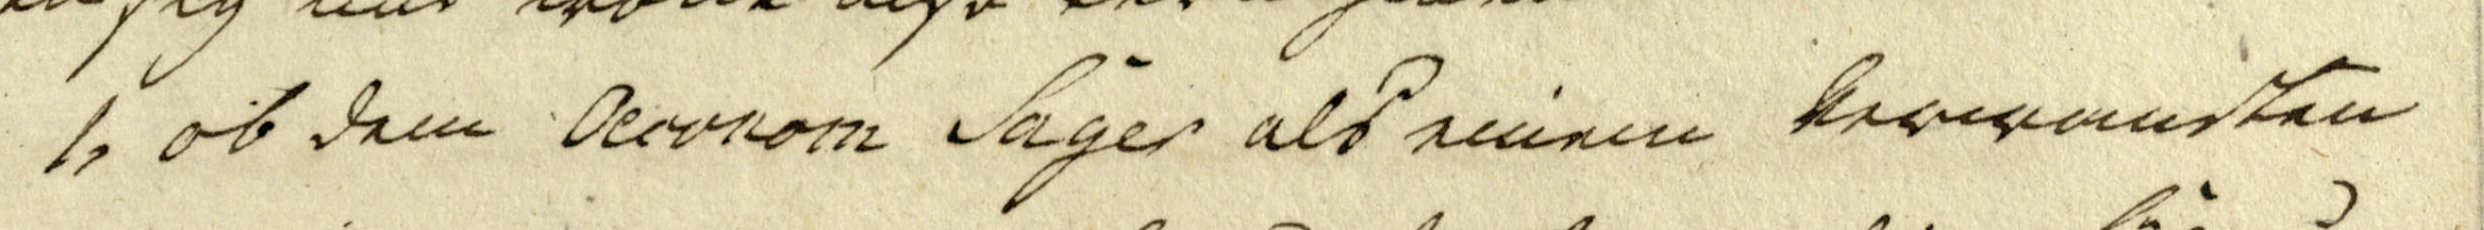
1, ob dem Oeconom Sager als einem Verwandten
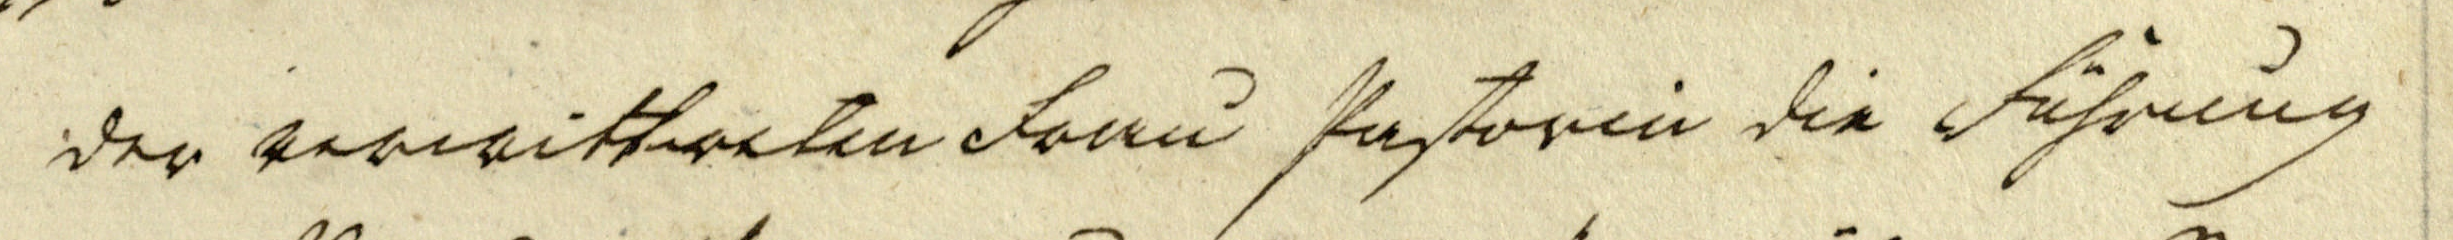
der verwittweten Frau Pastorin die Führung
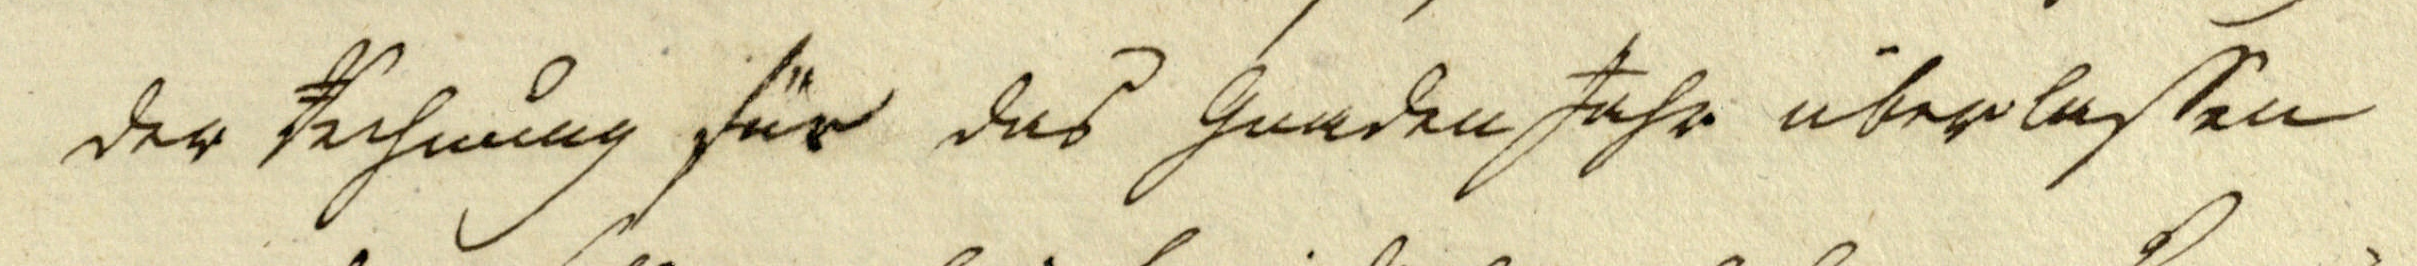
der Rechnung für das Gnaden Jahr überlassen
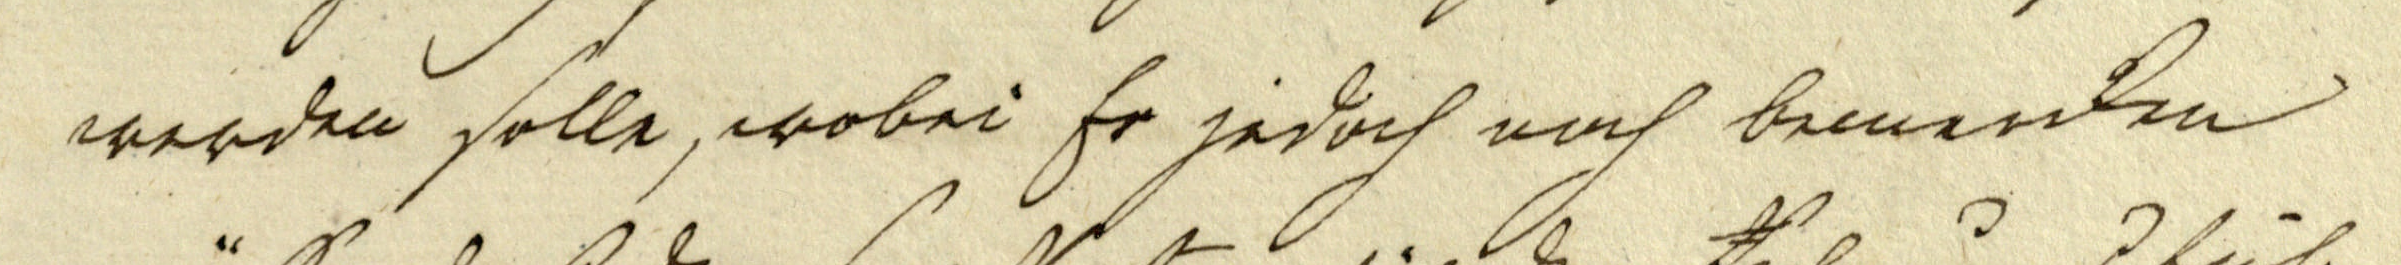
werden solle, wobei Er jedoch noch bemercken
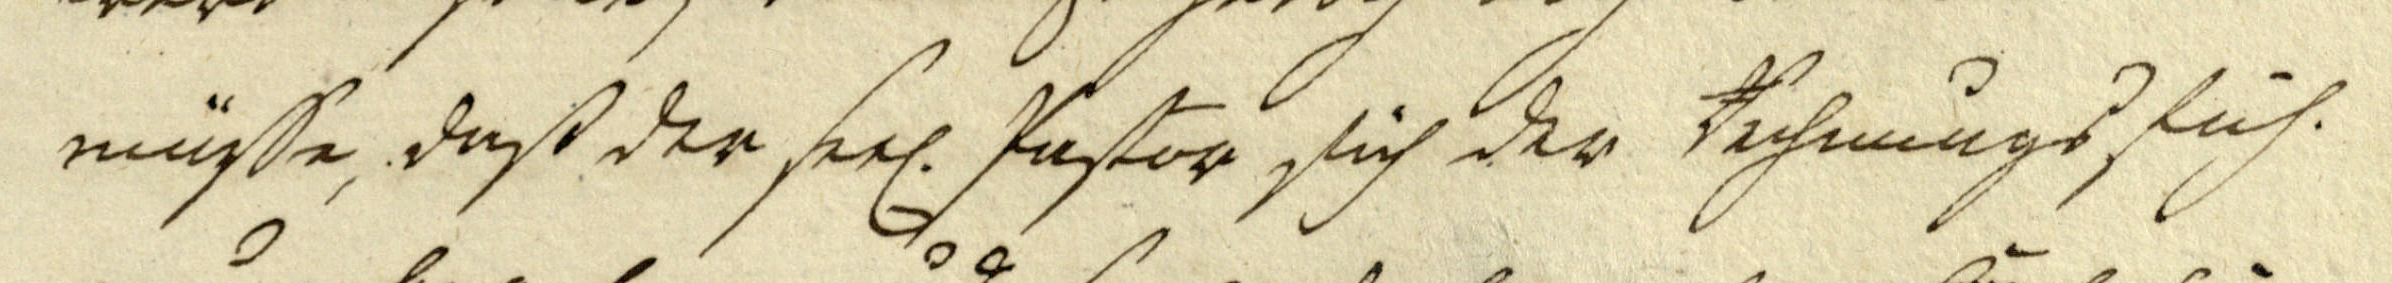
müsse, daß der seel. Pastor sich der Rechnungsfüh¬
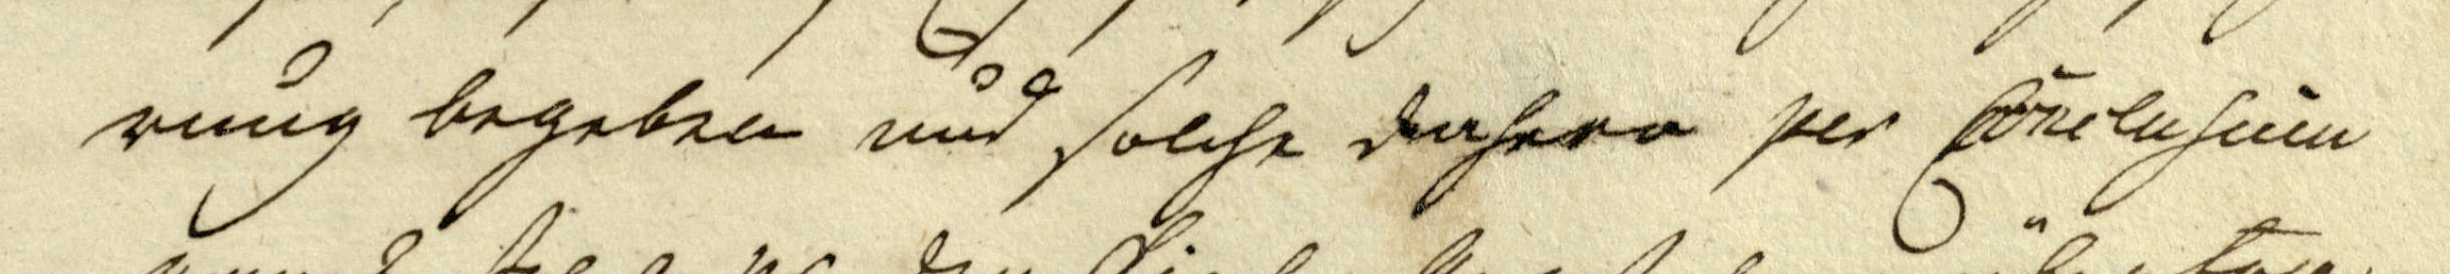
rung begeben und solche dahero per Conclusum
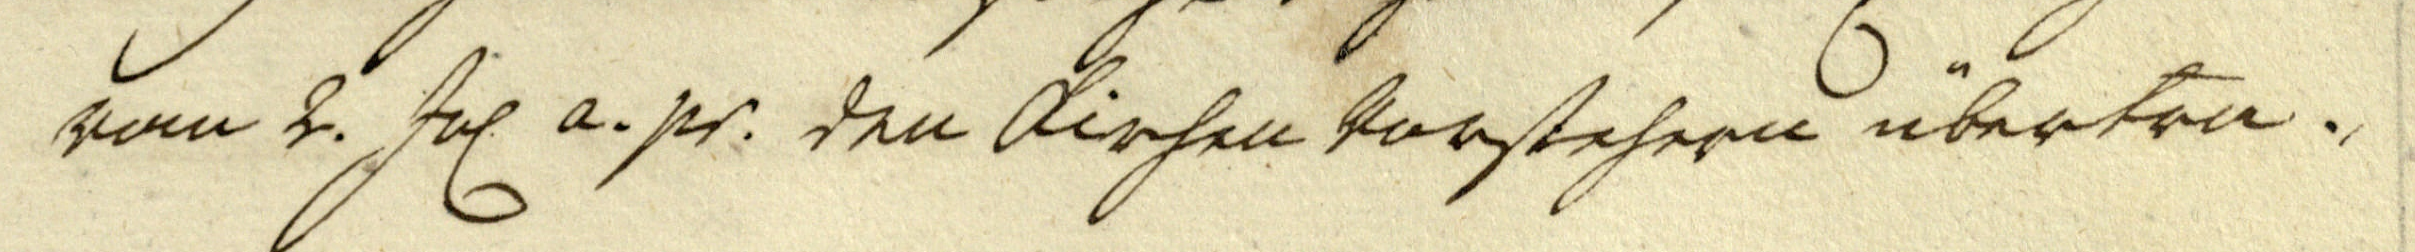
vom 2. Jul. a. pr. den Kirchen Vorstehern übertra¬
